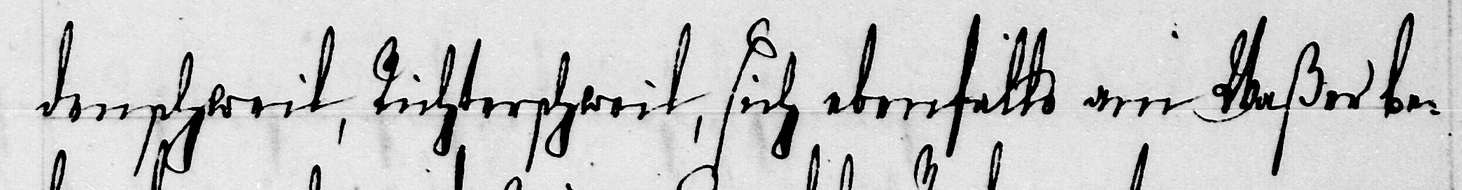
denschweil, Richterschweil, sich ebenfalls am Waßer be¬
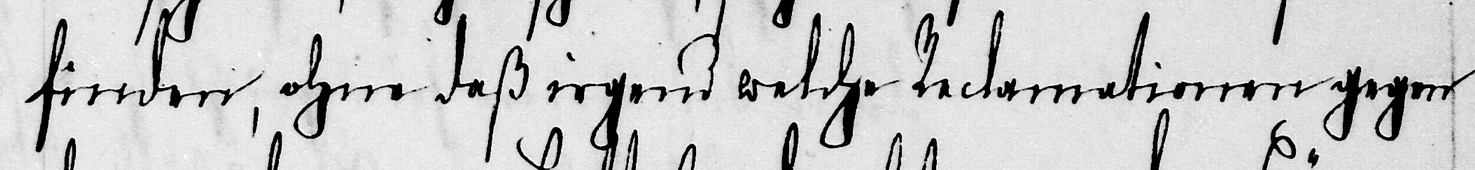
finden, ohne daß irgend welche Reclamationen gegen
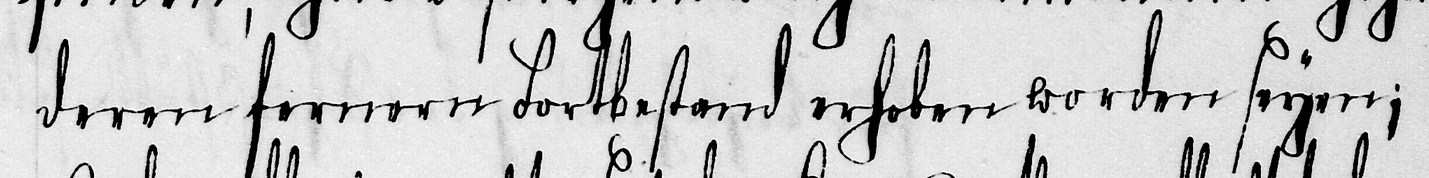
deren fernern Fortbestand erhoben worden seyen;
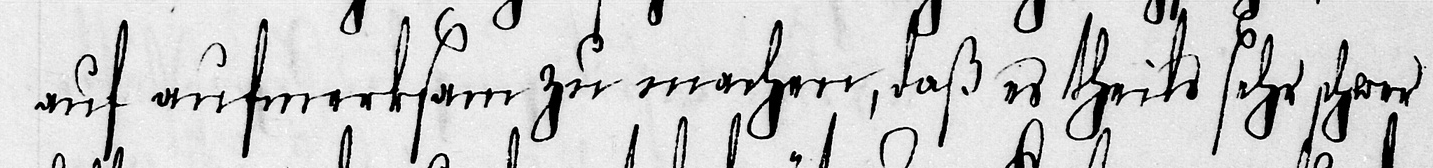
auf aufmerksam zu machen, daß es theils sehr schwer
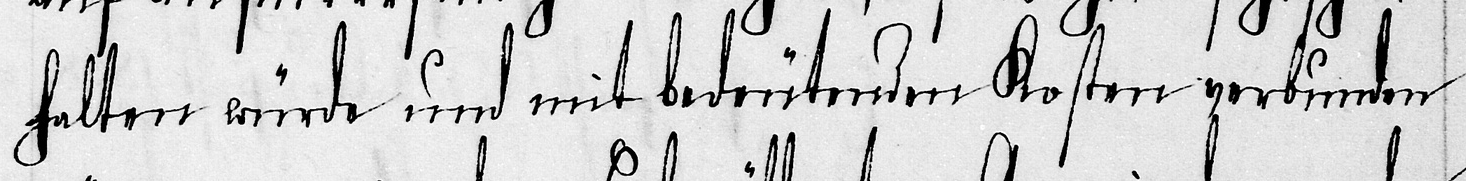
halten würde und mit bedeutenden Kosten verbunden
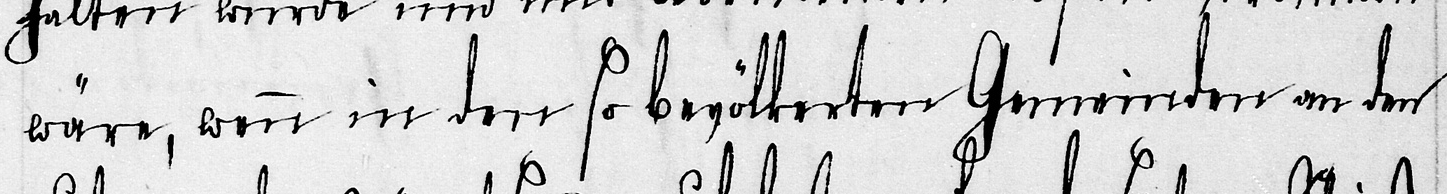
wäre, wenn in den so bevölkerten Gemeinden an den
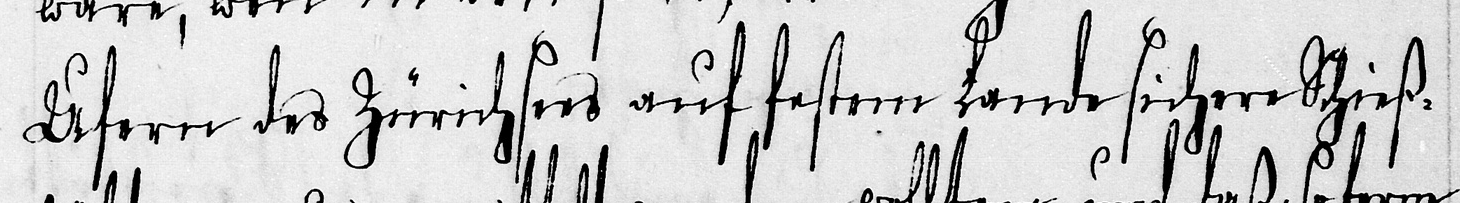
Ufern des Zürichsees auf festem Lande sichere
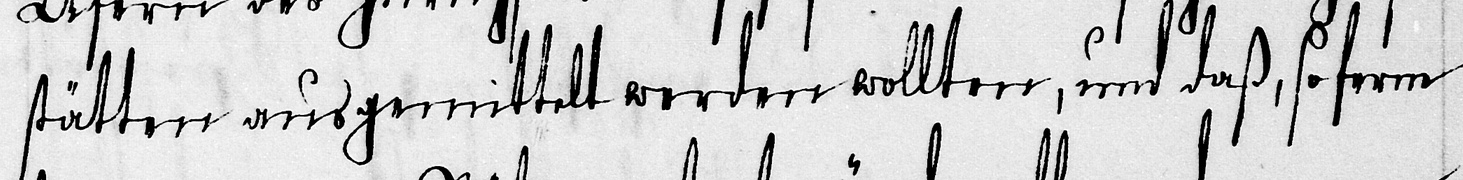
stätten ausgemittelt werden wollten, und daß, sofern
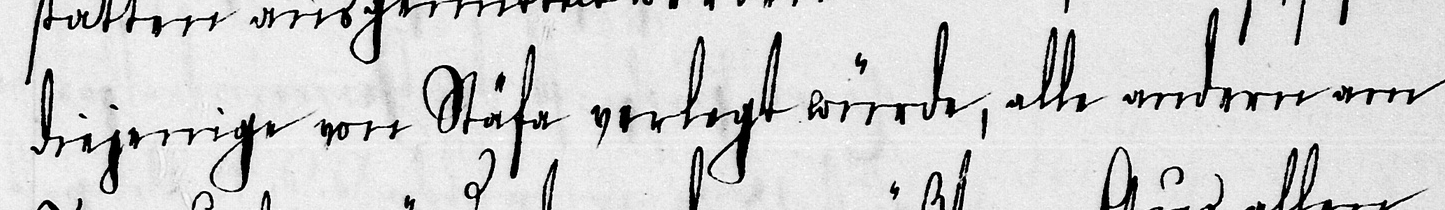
diejenige von Stäfa verlegt würde, alle andern am
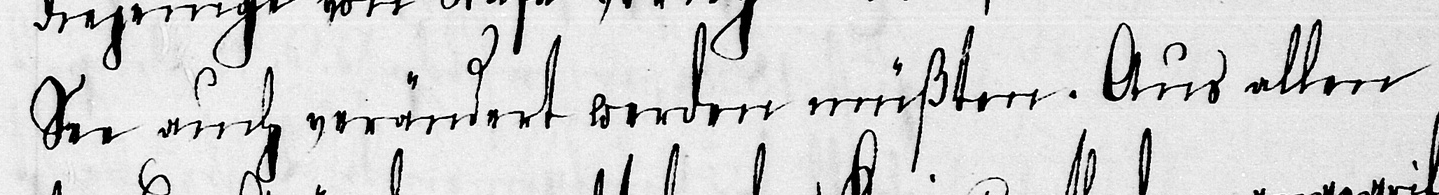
See auch verändert werden müßten. Aus allen
